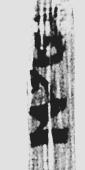○（吾）
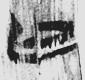㠯（以）
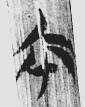尔（爾）
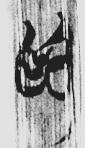爲
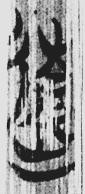遠
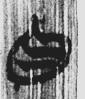目
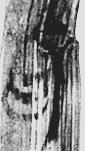耳
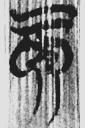而
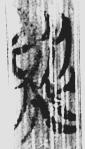縱
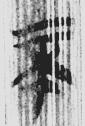不
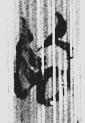爲
